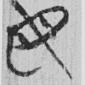母
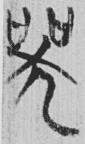哭
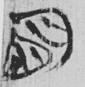晦
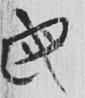母
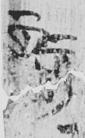訶（歌）
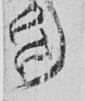弦
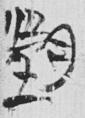望
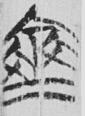齊
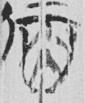○（宿）
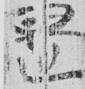是
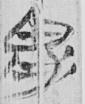{胃刀}（謂）
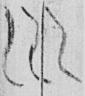川（順）
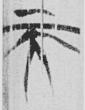天
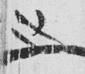之
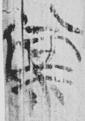○（常）
